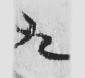九
